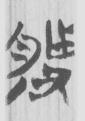{肉乍又}
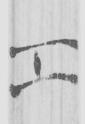工
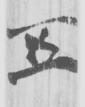五
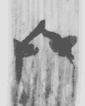夂
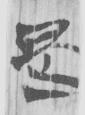是
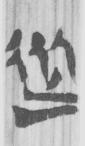從
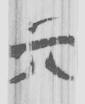亓
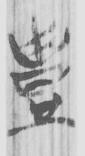豊
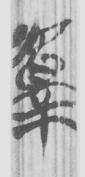鬳
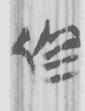於
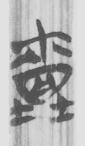{㐭土土}
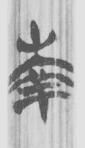南
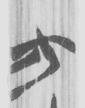方
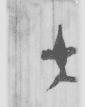{十六}
